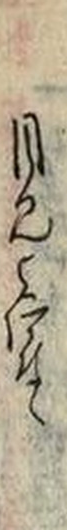目見被仰付候
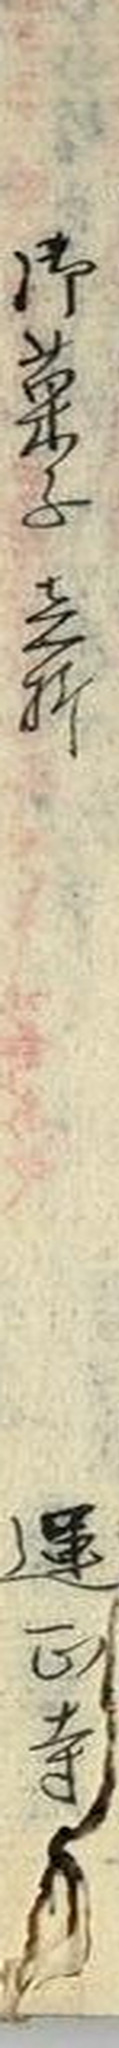御菓子壱折運正寺
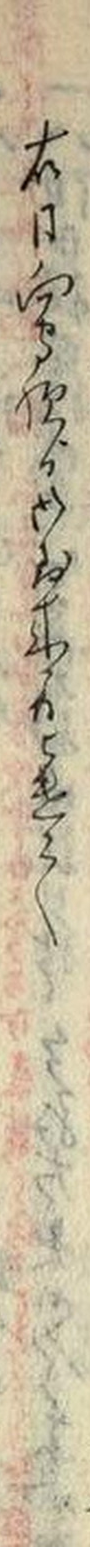右日向守様ゟ御到来ニ付被遣之
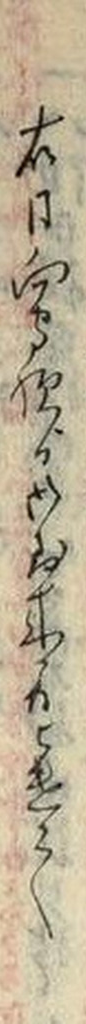右日向守様ゟ御到来ニ付被遣之
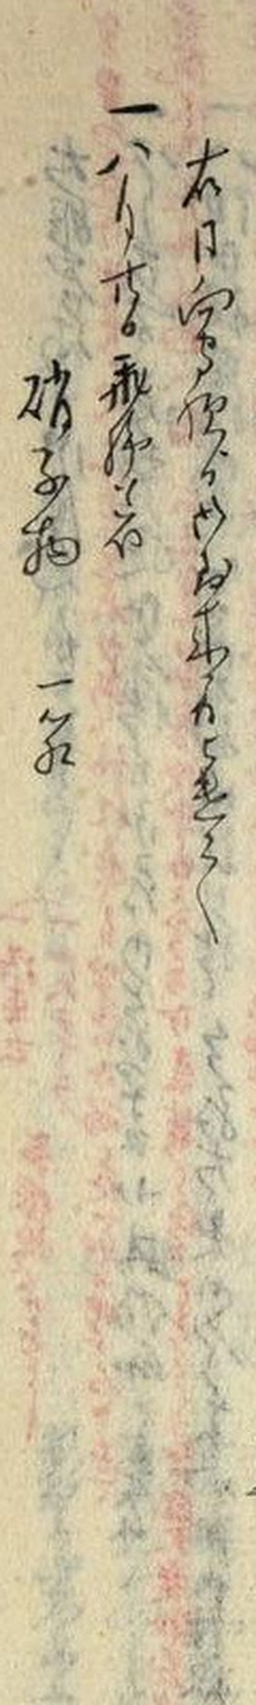一八月廿日飛脚着
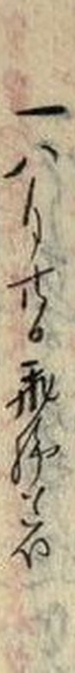一八月廿日飛脚着
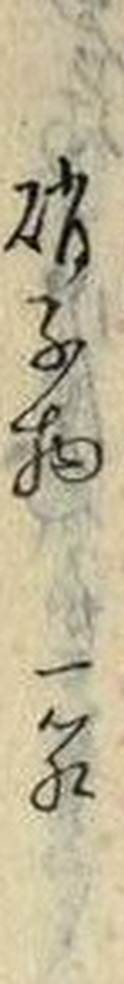硝子物一箱

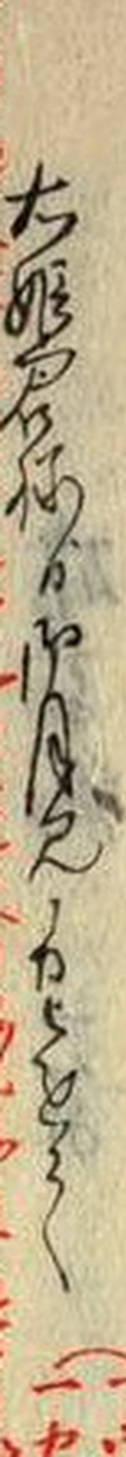右姫君様ゟ御月見ニ付被進之
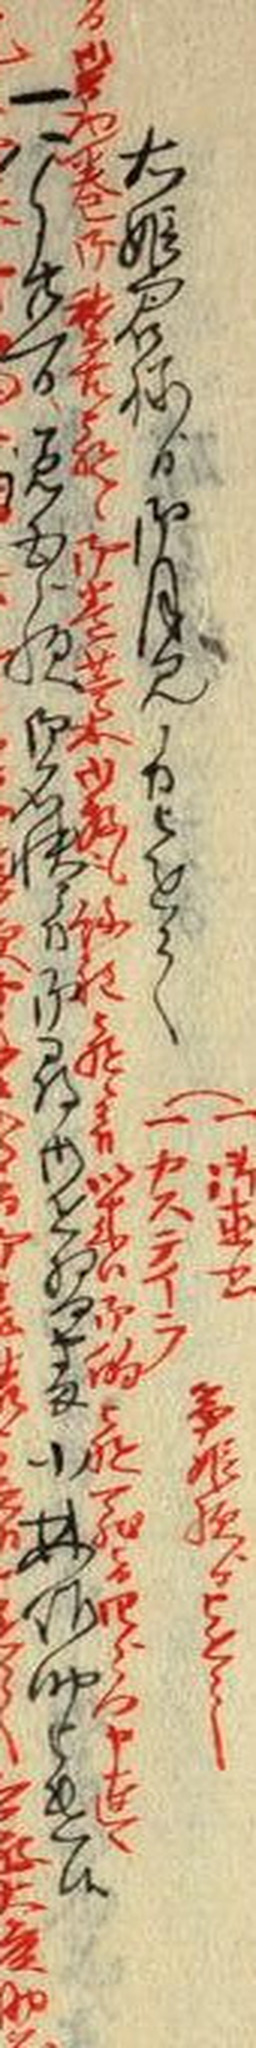一八月廿一日謙五郎様御不快ニ付御尋御近習番小林作助被遣候
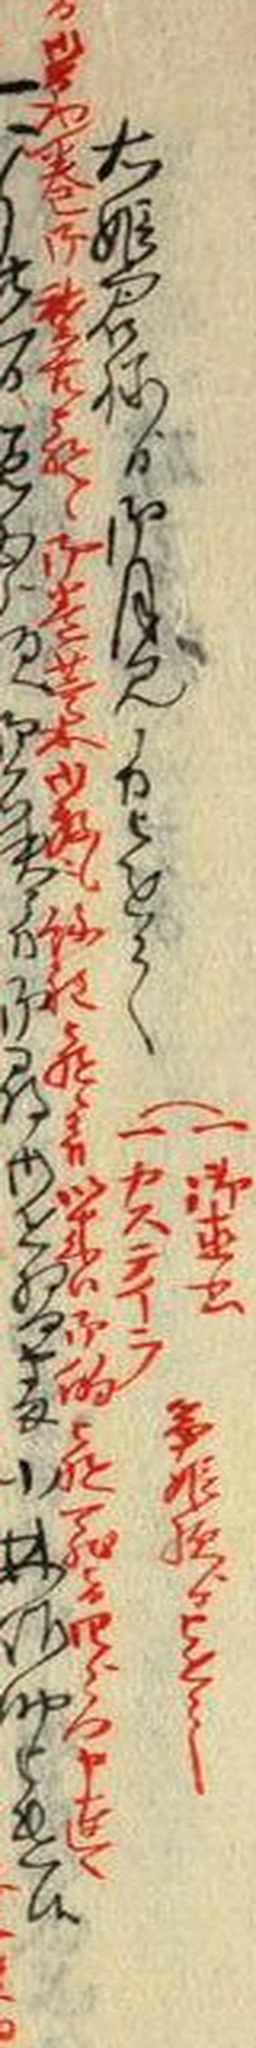一八月廿一日謙五郎様御不快ニ付御尋御近習番小林作助被遣候
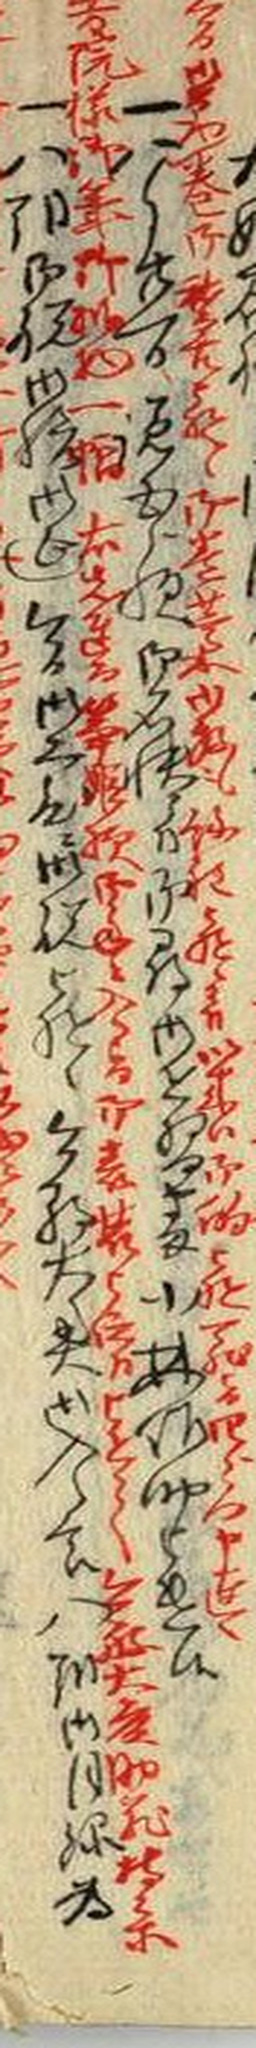一八朔御祝御膳御延今日御二度ニ御祝被遊候今朝大奥御入之節八朔御目録為
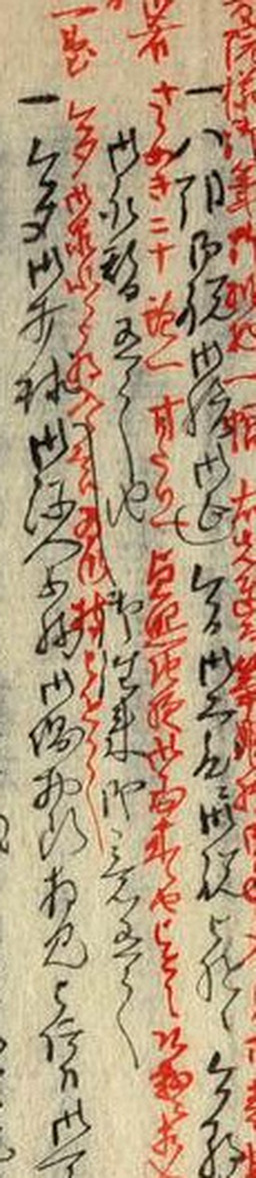御取替有之由御往来御意有之
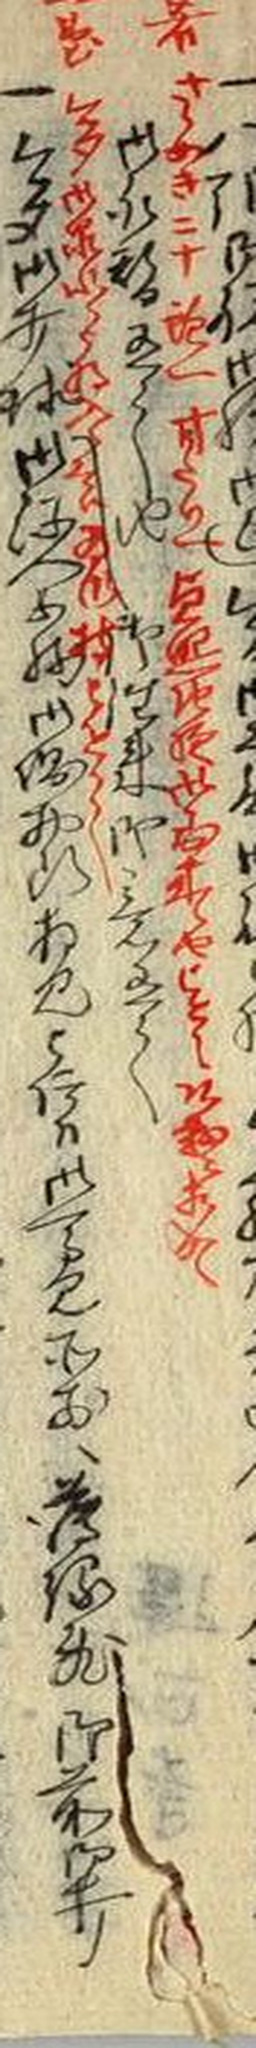一今夕御打毬御役人不残御側物頭拝見被仰付御馬見所前へ薄縁敷御前御打
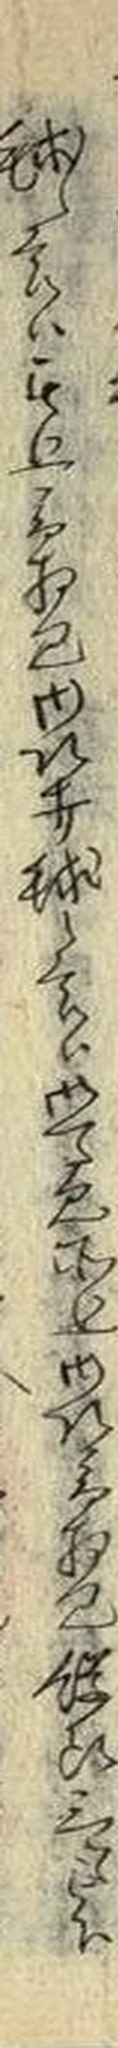毬之節ハ其上ニ而拝見御次打毬之節ハ御馬見所上御次ニ而拝見饅頭三ツヽ被下
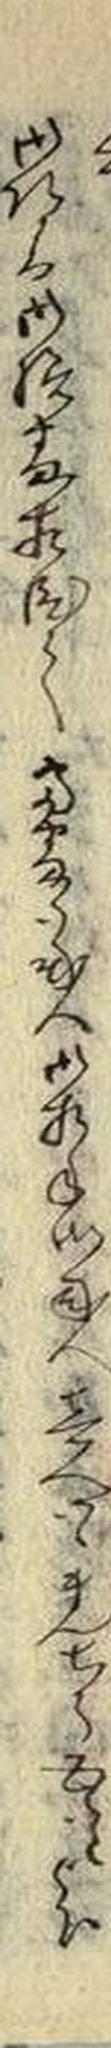御次ニ而御膳番相渡之当番御用人御相手御用人壱人ツヽまんちう五ツヽ被下
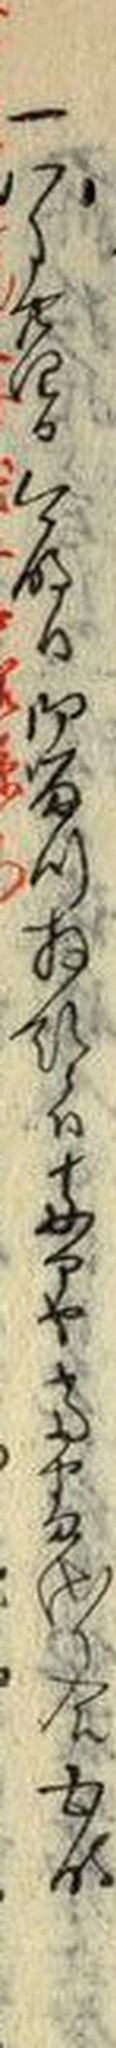一八月廿四日今明日御留川拝領ニ付両部や当番代り合五時
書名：少傅日録抄（斉承付側向頭取日記、在国）
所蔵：福井県文書館 Fukui Prefectural Archives
